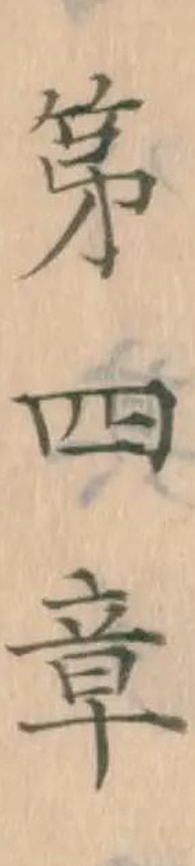第四章
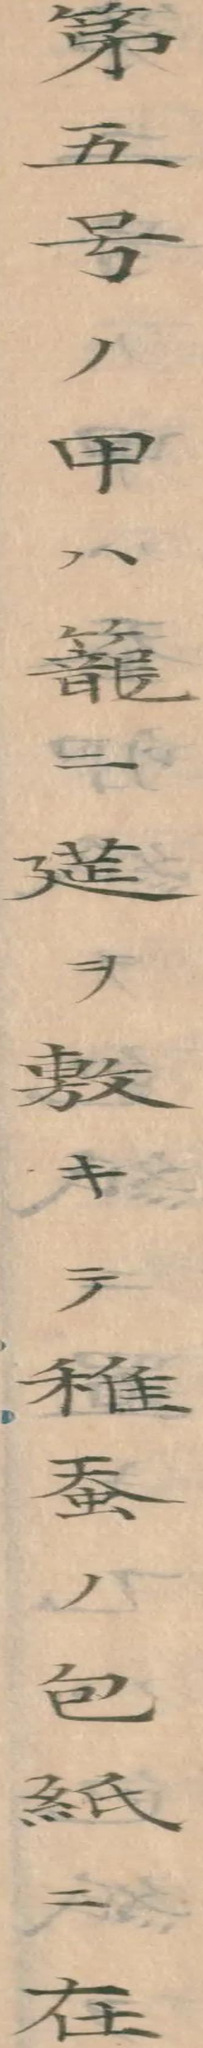第五号ノ甲ハ籠ニ莚ヲ敷キテ稚蚕ノ包紙ニ在
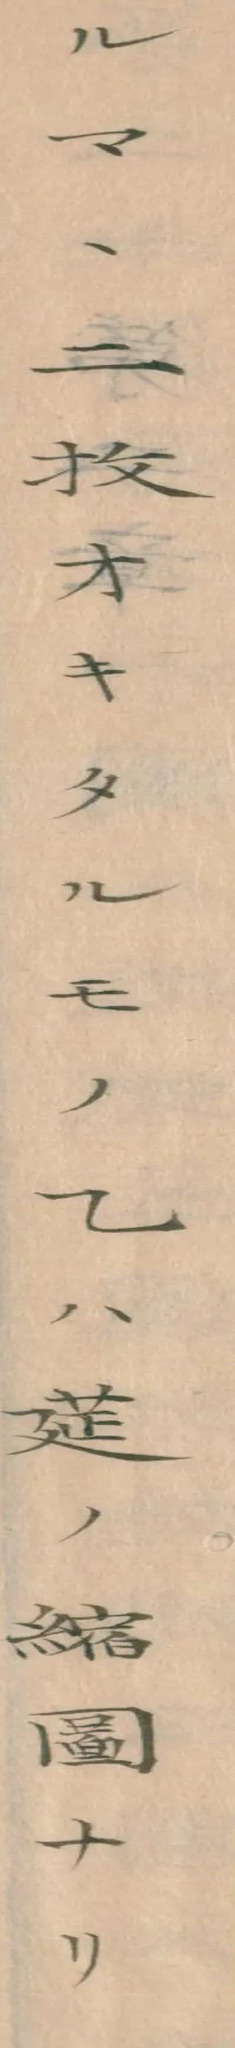ルマヽ二枚オキタルモノ乙ハ莚ノ縮図ナリ
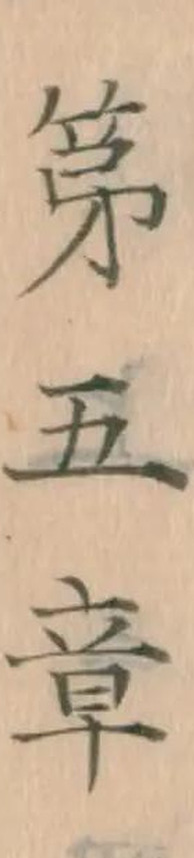第五章
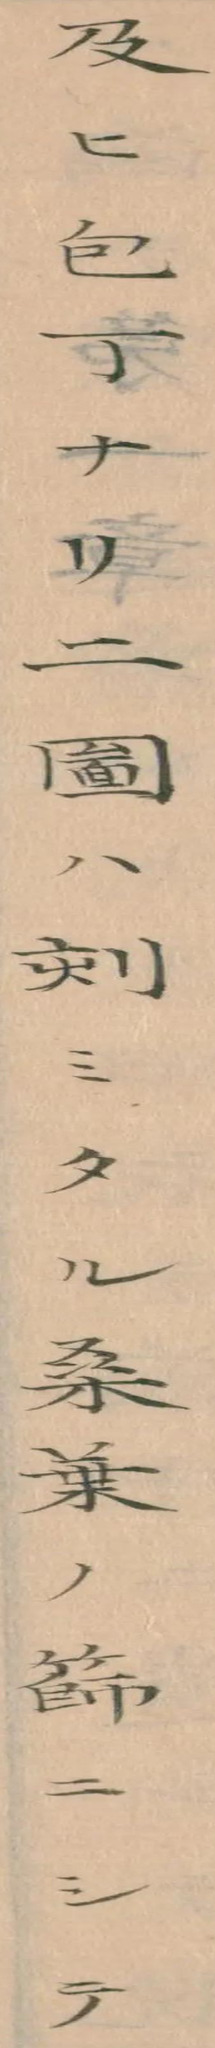及ヒ包丁ナリ二図ハ刻ミタル桑葉ノ篩ニシテ
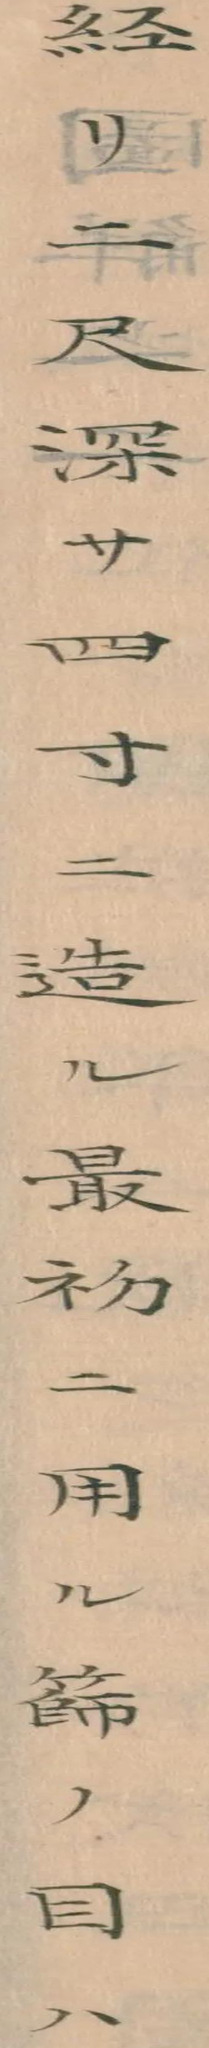経リ二尺深サ四寸ニ造ル最初ニ用ル篩ノ目ハ
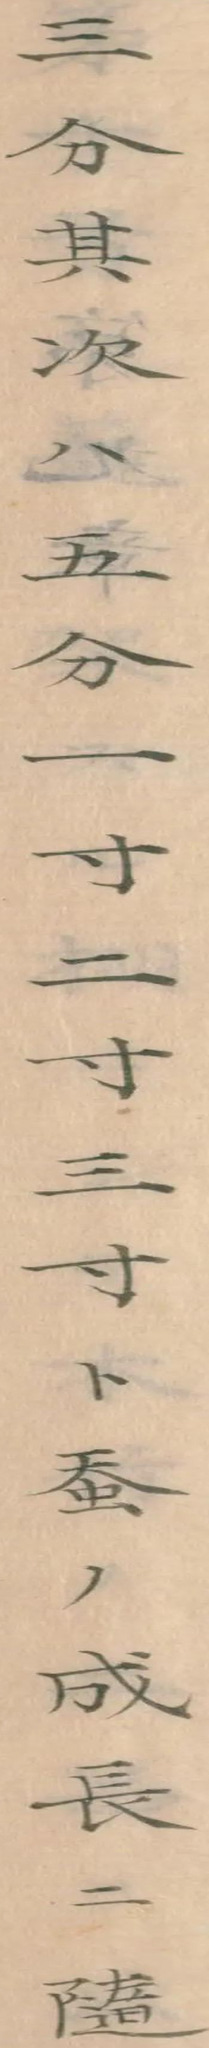三分其次ハ五分一寸二寸三寸ト蚕ノ成長ニ随
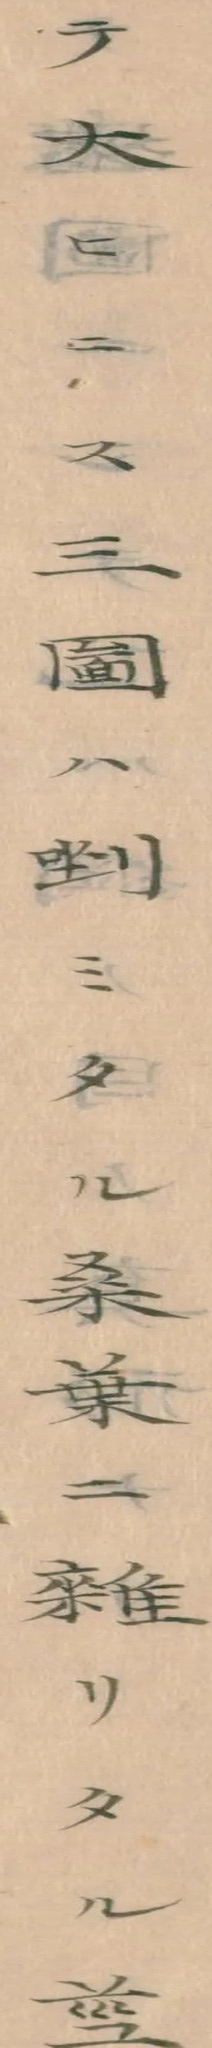テ大ヒニス三図ハ剉ミタル桑葉ニ雑リタル茎
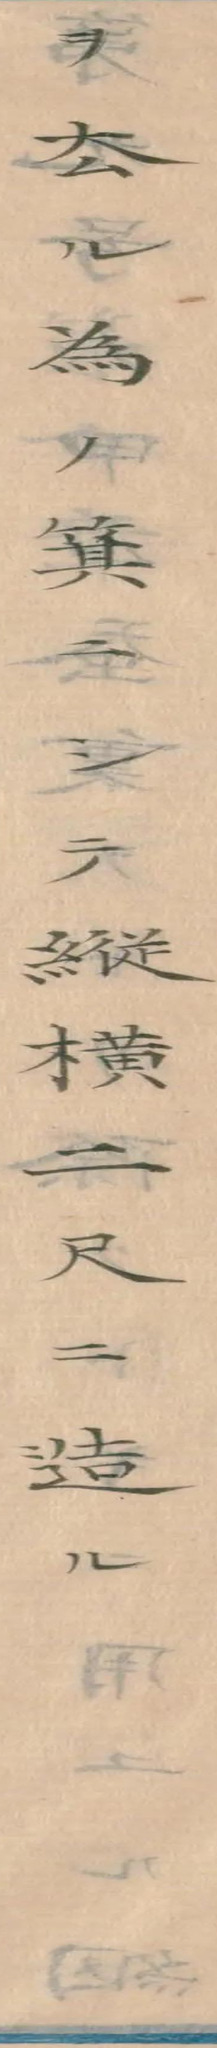ヲ去ル為ノ箕ニシテ縦横二尺ニ造ル
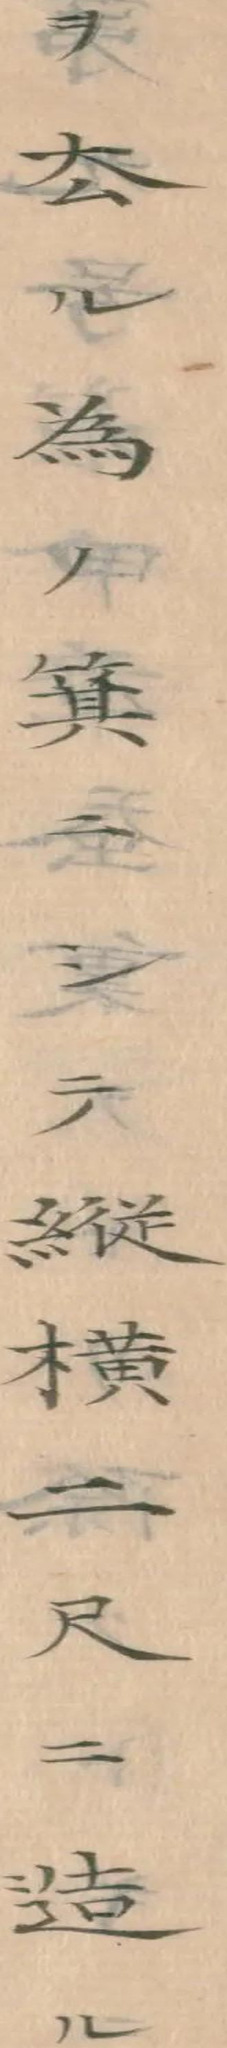ヲ去ル為ノ箕ニシテ縦横二尺ニ造ル
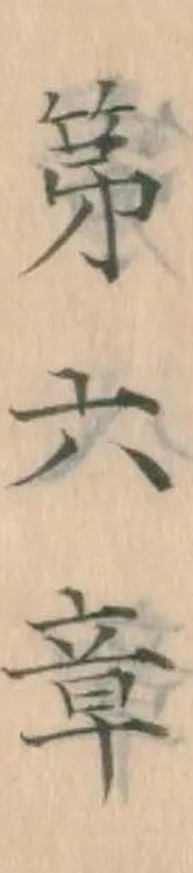第六章
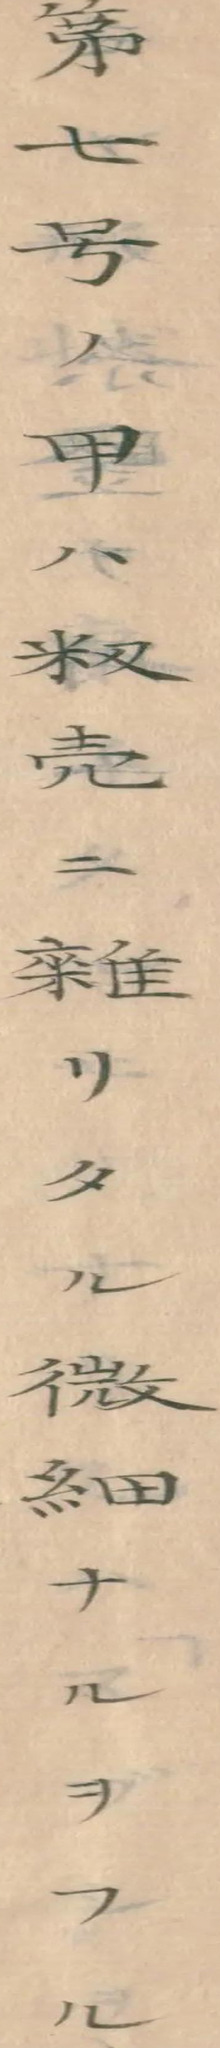第七号ノ甲ハ籾売ニ雑リタル微細ナルヲフル
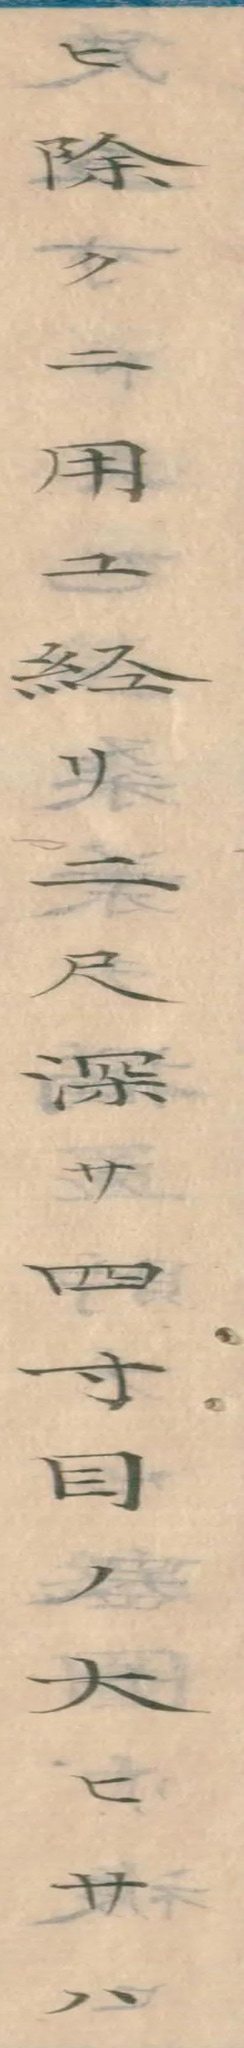ヒ除クニ用ユ経リ二尺深サ四寸目ノ大ヒサハ
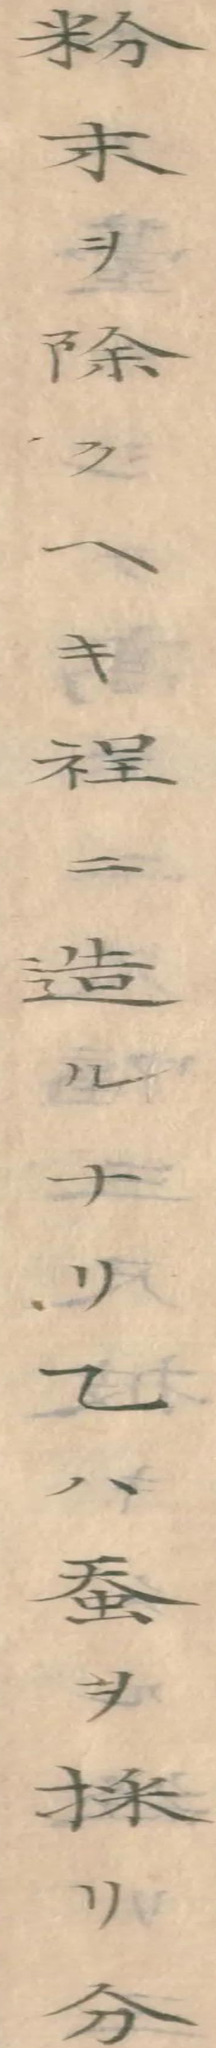粉末ヲ除クヘキ程ニ造ルナリ乙ハ蚕ヲ採リ分
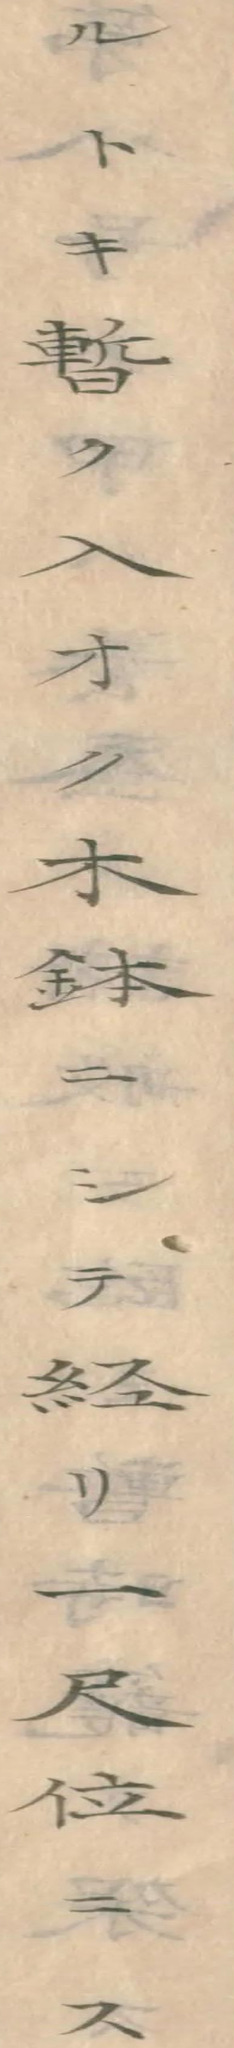ルトキ暫ク入オク木鉢ニシテ経リ一尺位ニス
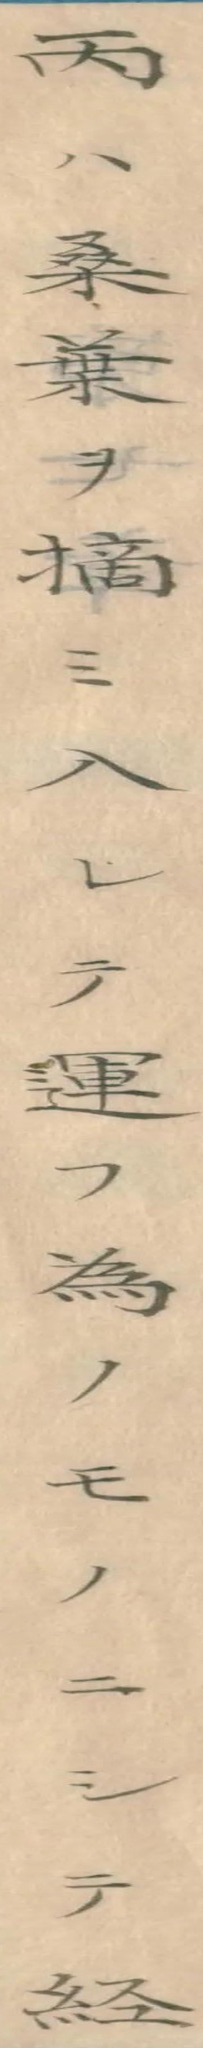丙ハ桑葉ヲ摘ミ入レテ運フ為ノモノニシテ経
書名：蚕桑集成
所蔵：国立国会図書館 National Diet Library, JAPAN
